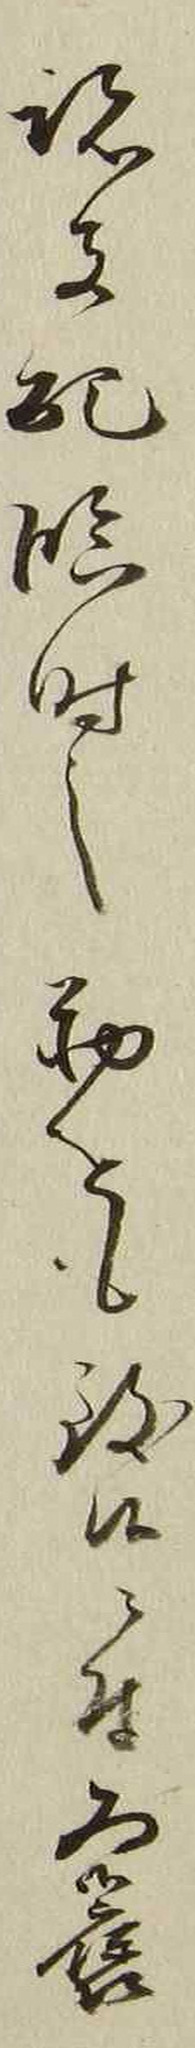諸支配臨時之勤めをも致し候ニ付き御褒
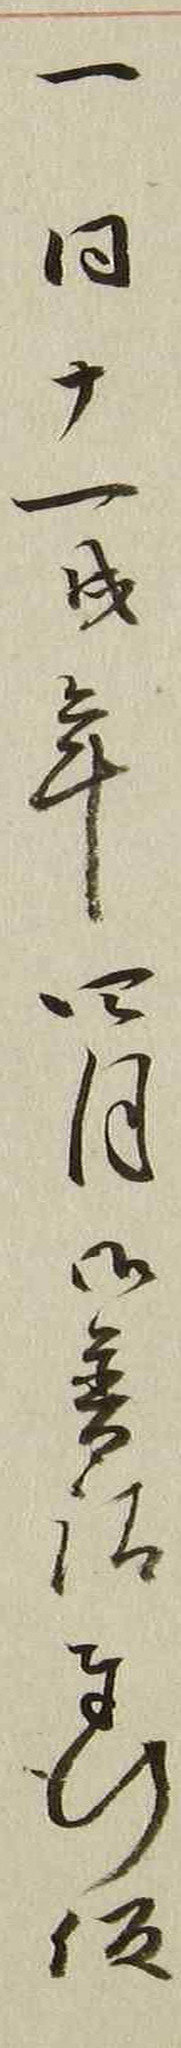一同十一戌年四月御普請奉行仮
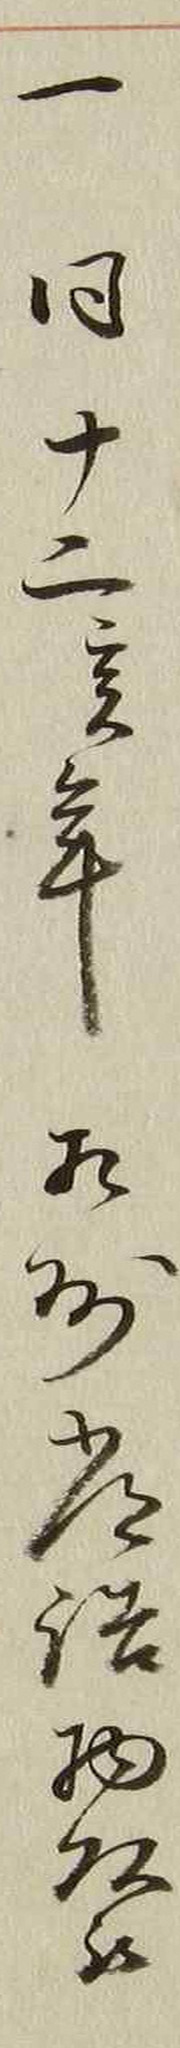一同十二亥年相州常詰物頭
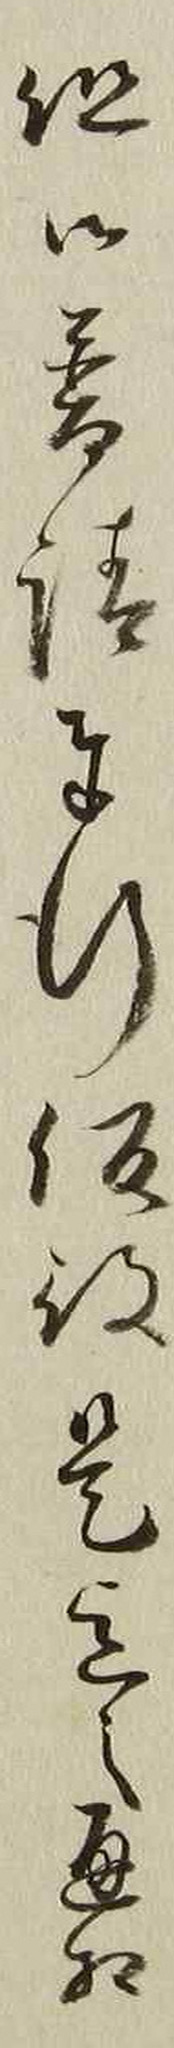但し御普請奉行仮役是迄之通り相
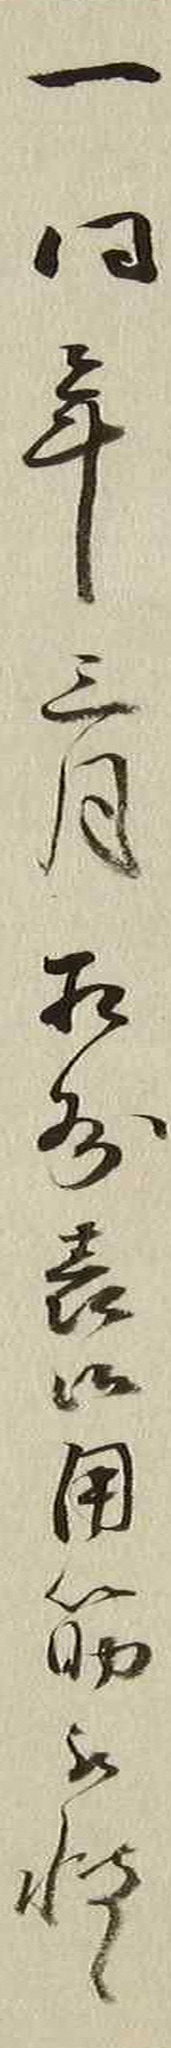一同年三月相州表御用筋転じられ候
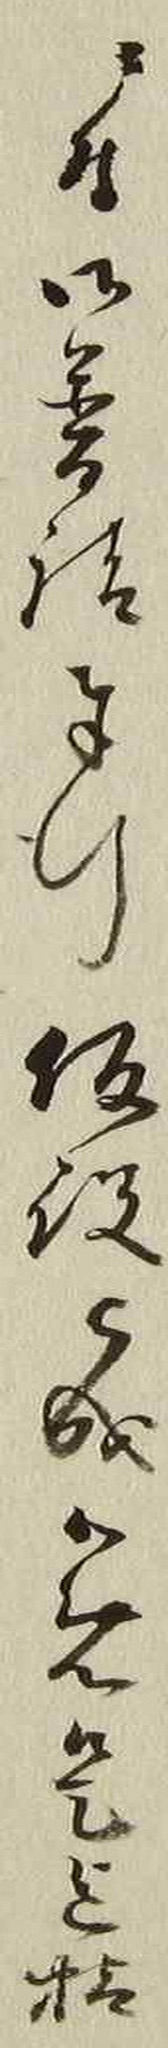ニ付き御普請奉行仮役御免成られ是迄精
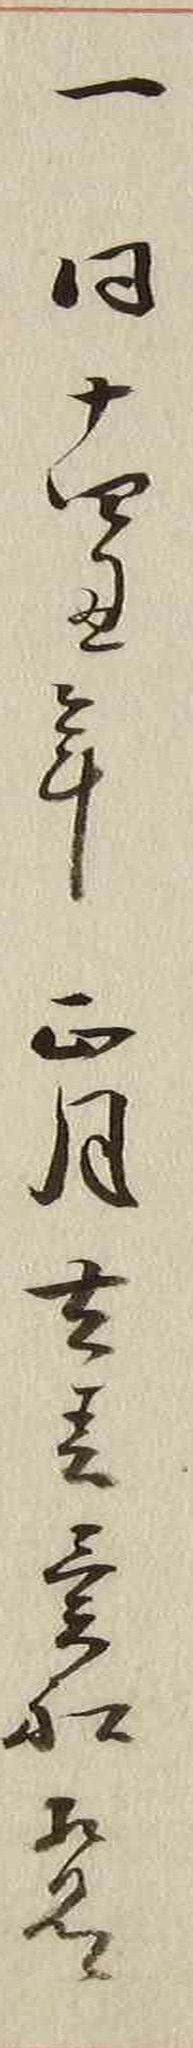一同十四丑年正月去春異船相見候
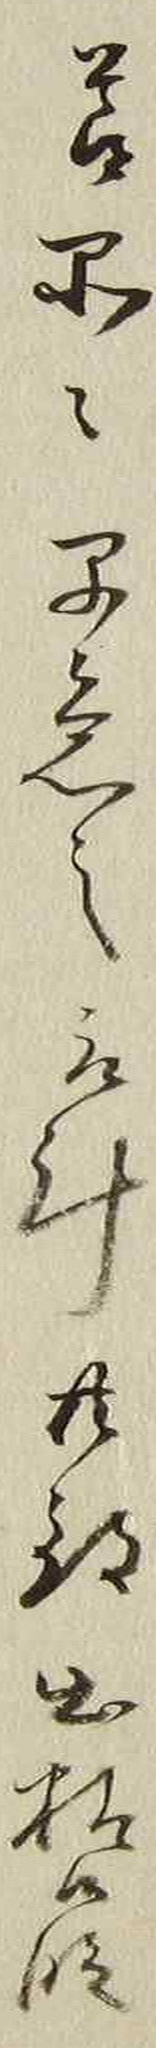節品々早急之取計い共出精致し候段
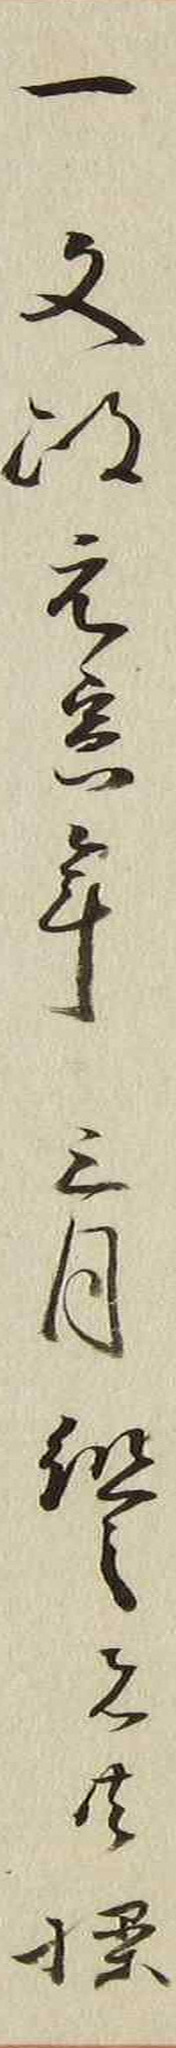一文政元寅年三月組之者共操
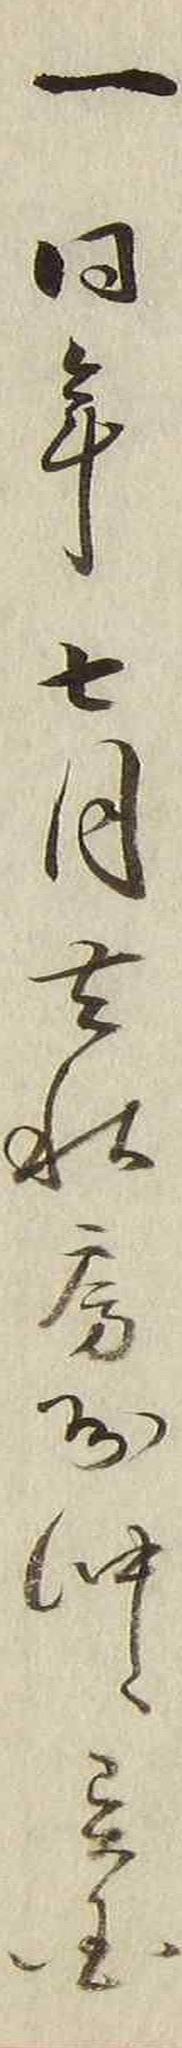一同年七月去秋房州沖へ異国

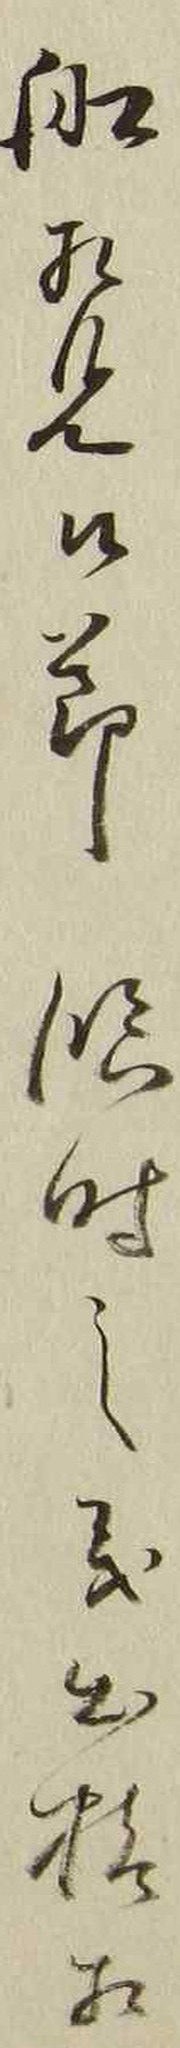船相見候節臨時之義出精相
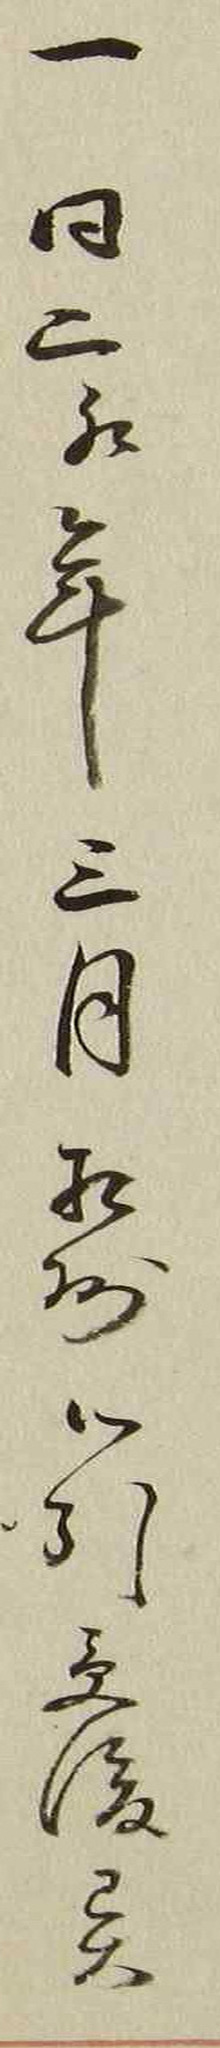一同二卯年三月相州御引き受け後異
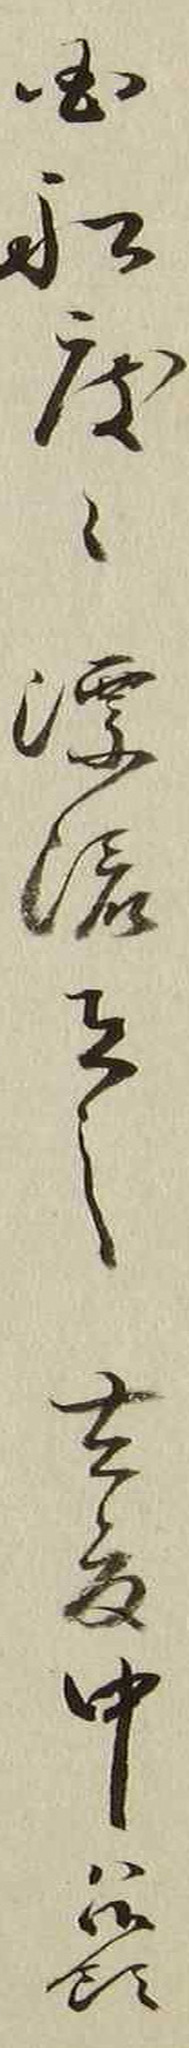国船度々漂流之在り去夏中ㇵ御領
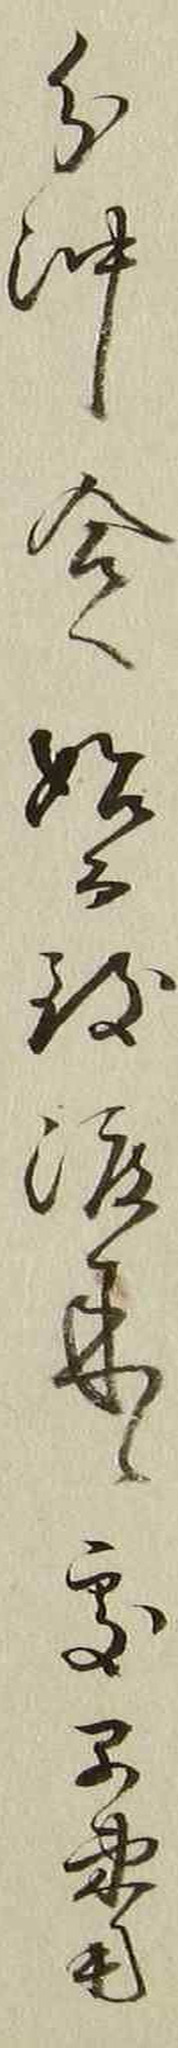分沖合へ始めて渡来致し候処早速用
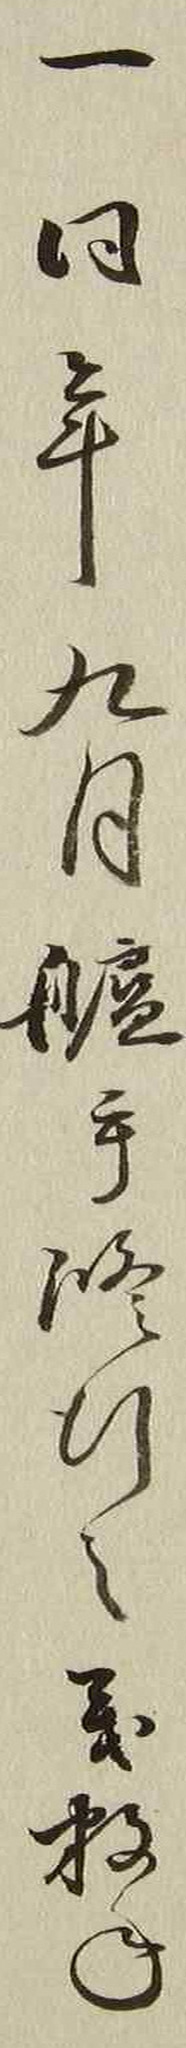一同年九月艪手修行之義数年
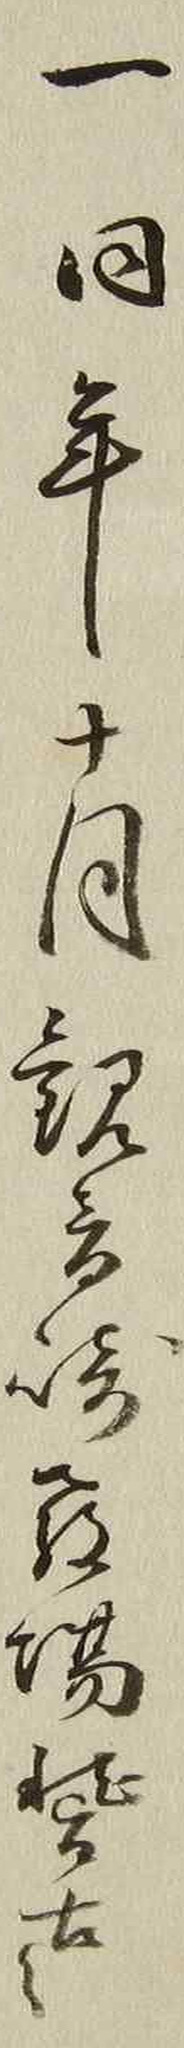一同年十月観音崎教場稽古之
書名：諸士系譜　巻之20　い之部20
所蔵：会津若松市立会津図書館
